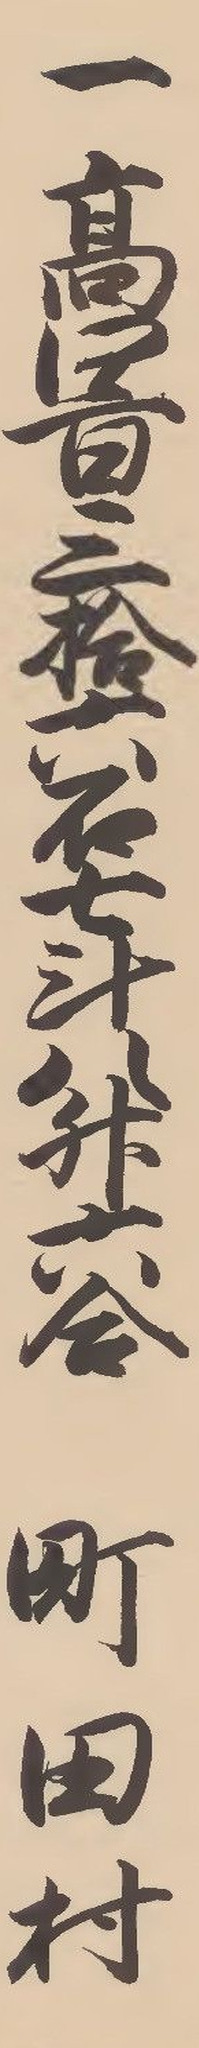一高四百三拾六石七斗八升六合町田村
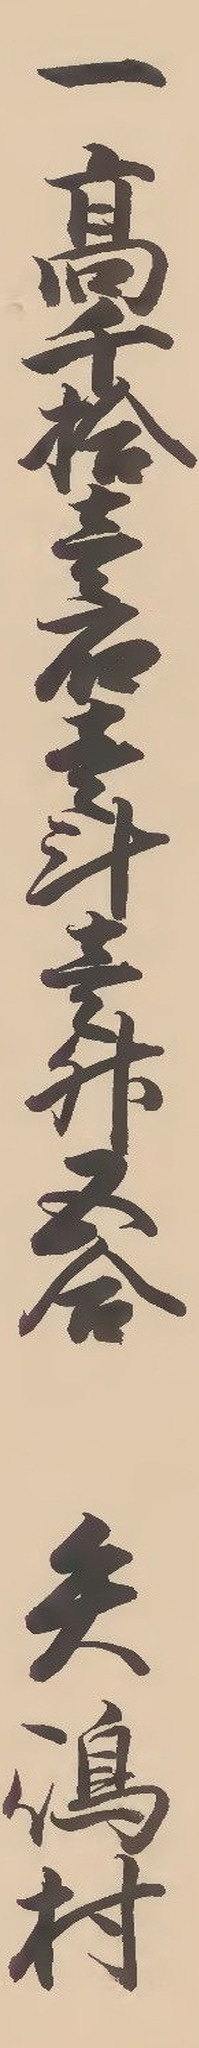一高千拾壱石壱斗壱升五合矢嶋村
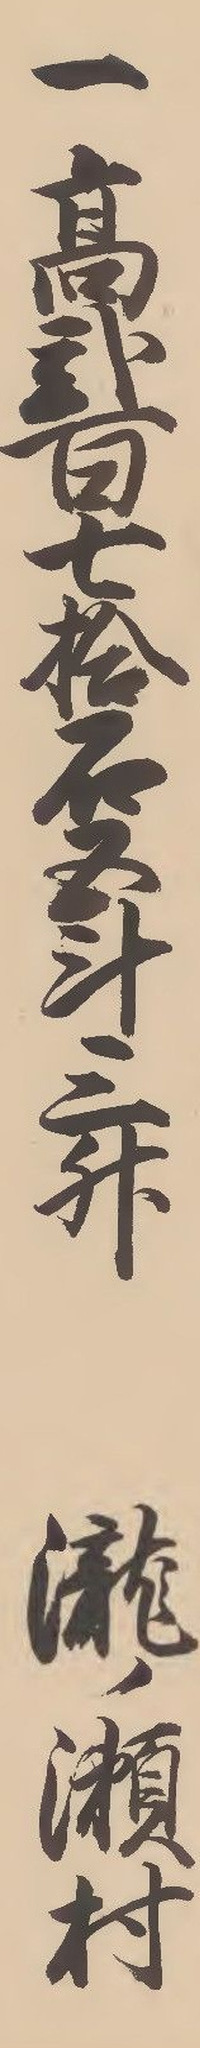一高弐百七拾石五斗三升滝ノ瀬村
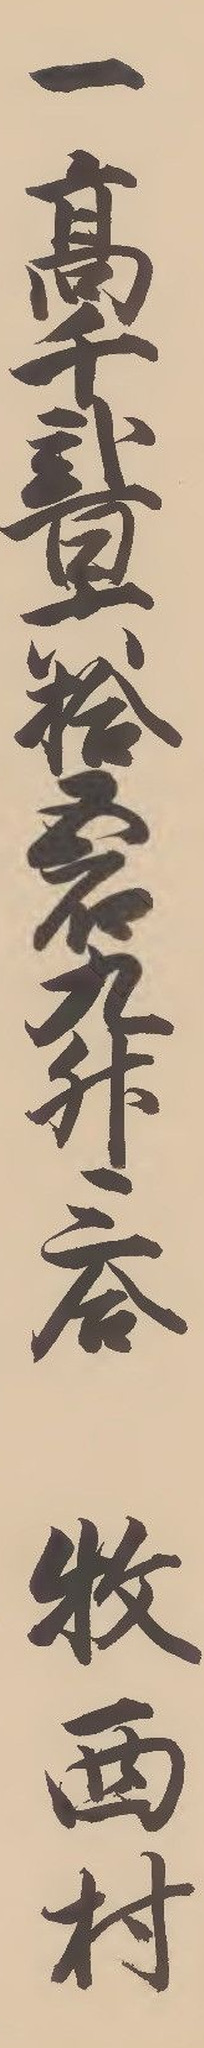一高千弐百六拾五石九升三合牧西村
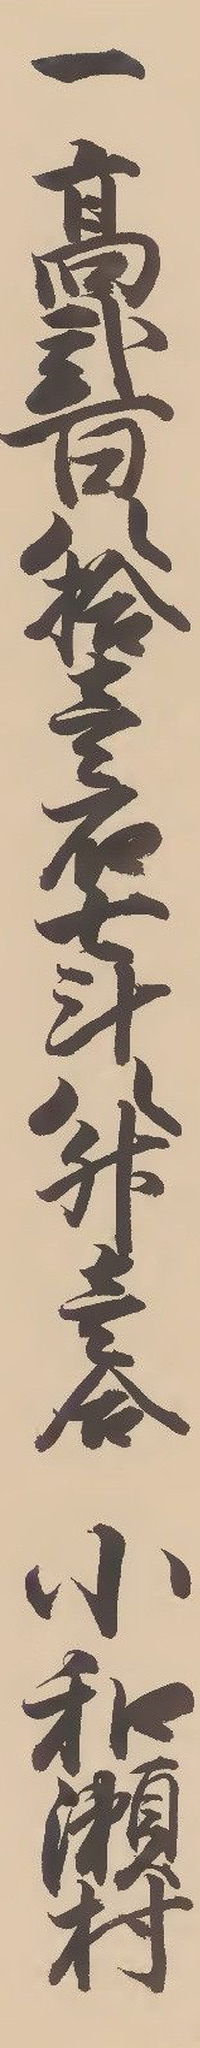一高弐百八拾壱石七斗八升壱合小和瀬村

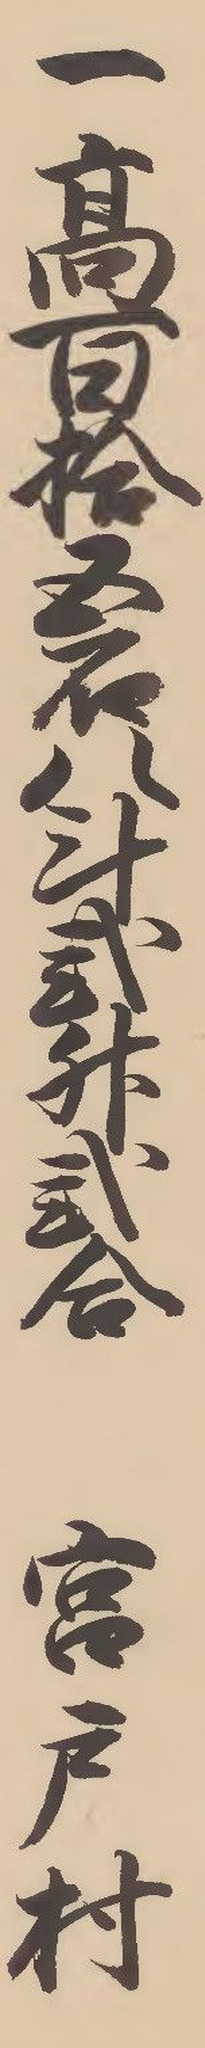一高百拾五石八斗弐升弐合宮戸村
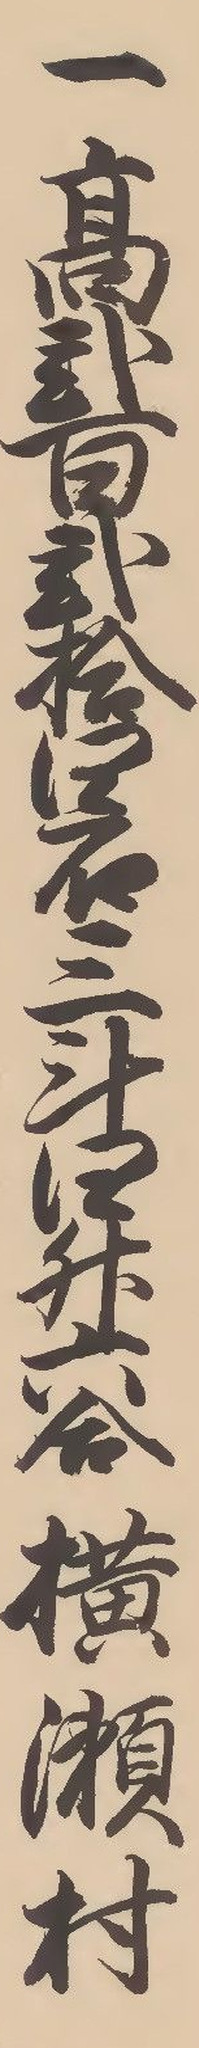一高弐百弐拾四石三斗四升六合横瀬村
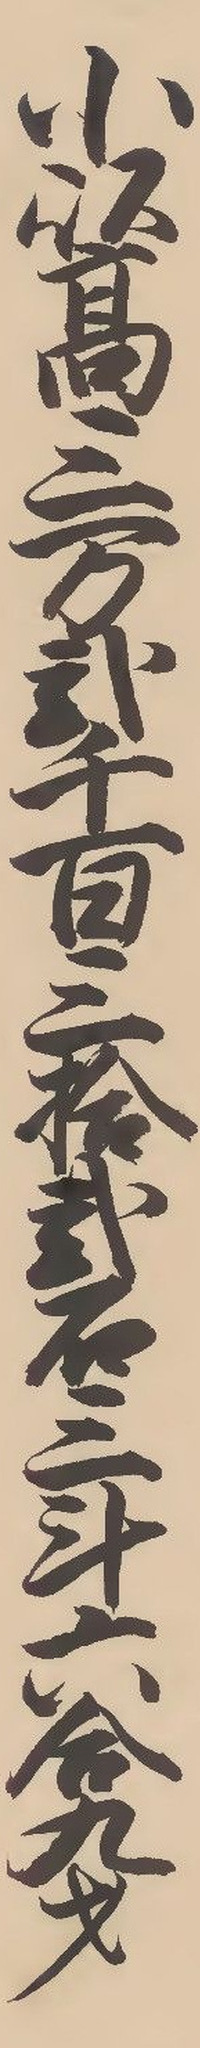小以高三万弐千百三拾弐石三斗六合九才
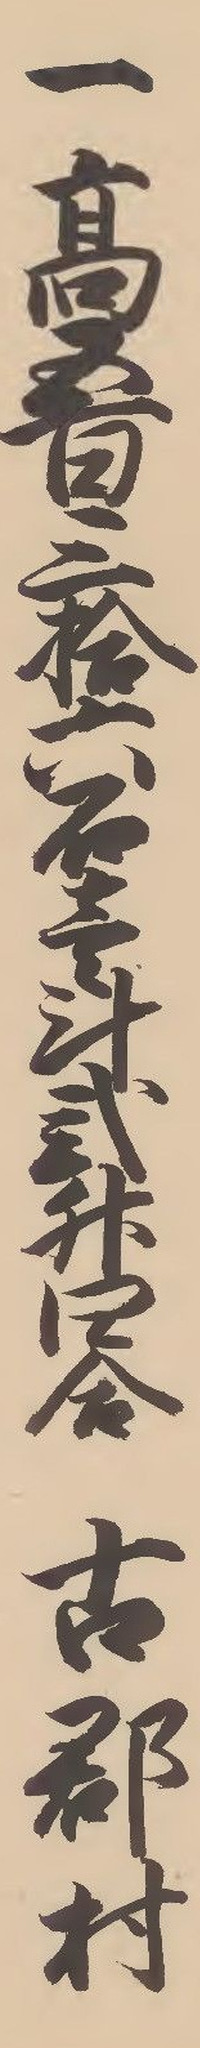一高五百三拾六石壱斗弐升四合古郡村
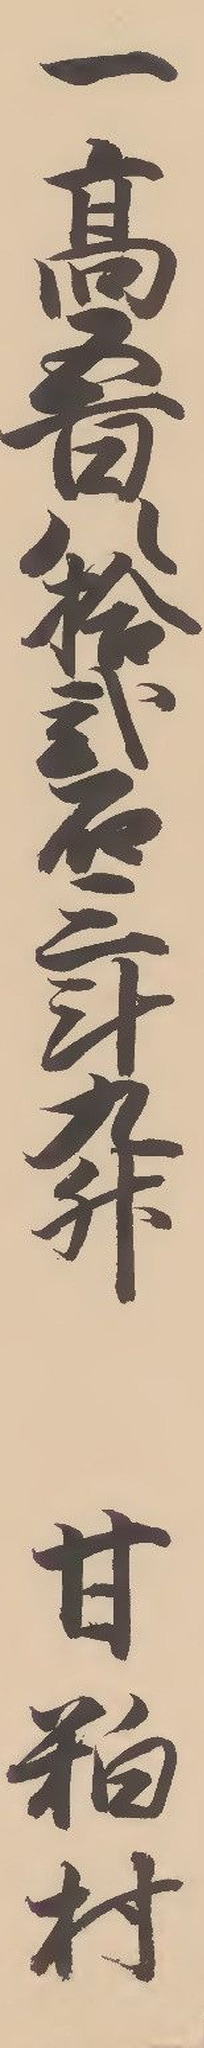一高五百八拾弐石三斗九升甘粕村

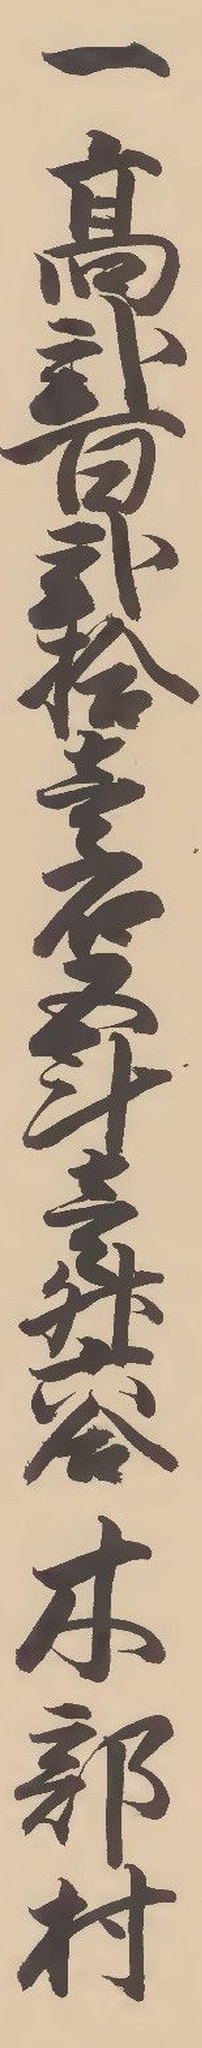一高弐百弐拾壱石五斗壱升六合木部村
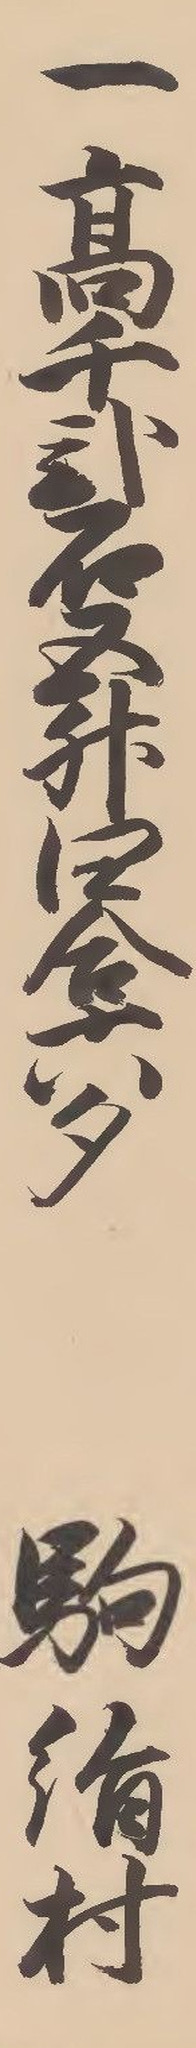一高千弐石五升四合六勺駒絹村
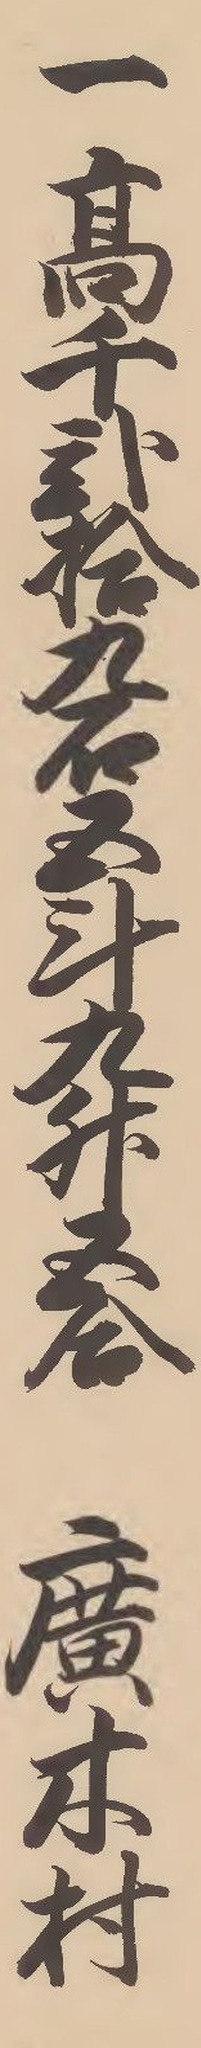一高千弐拾九石五斗九升五合広木村
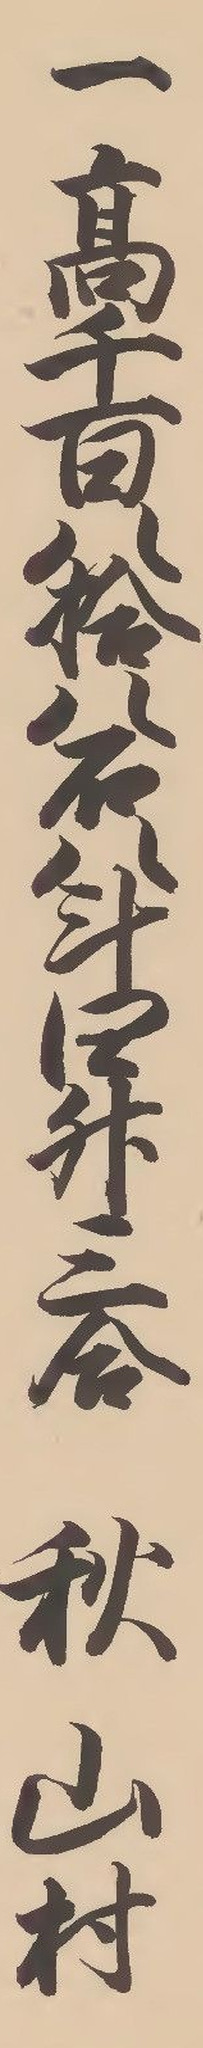一高千百八拾八石八斗四升三合秋山村
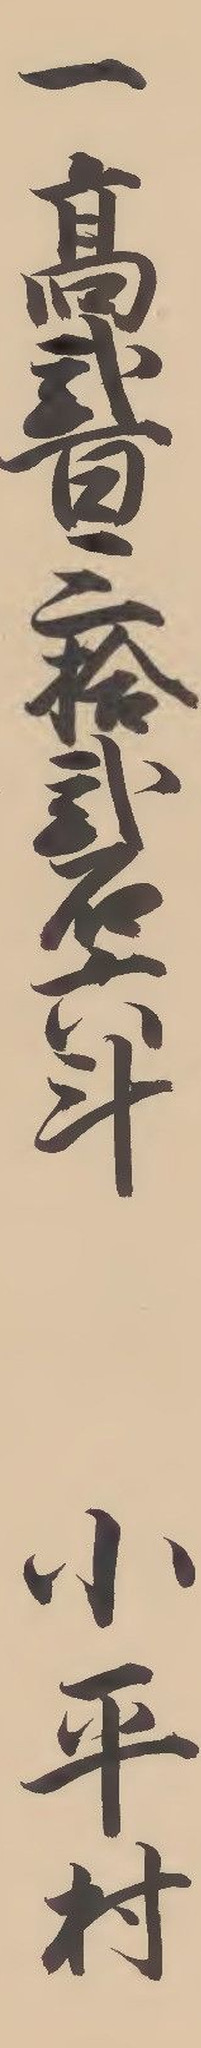一高弐百三拾弐石六斗小平村
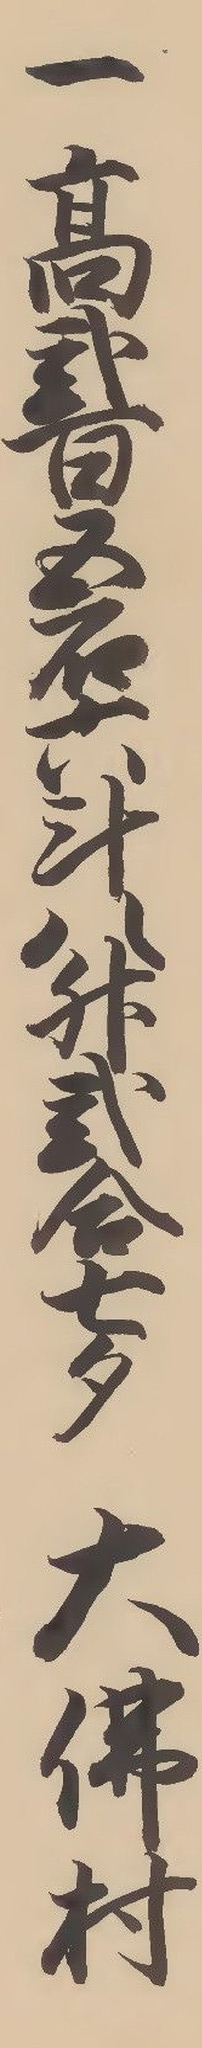一高弐百五石六斗八升弐合七勺大仏村
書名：武蔵国郷帳　下
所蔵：国立公文書館 National Archives of Japan
